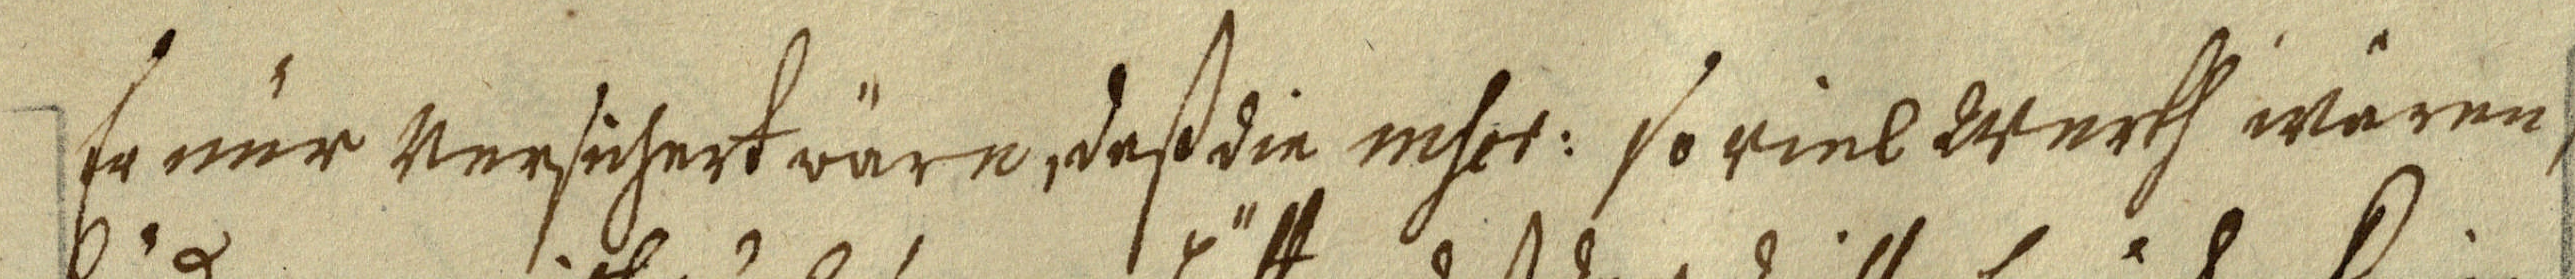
Er nur versichert wäre, daß die mscr. so viel werth wären,
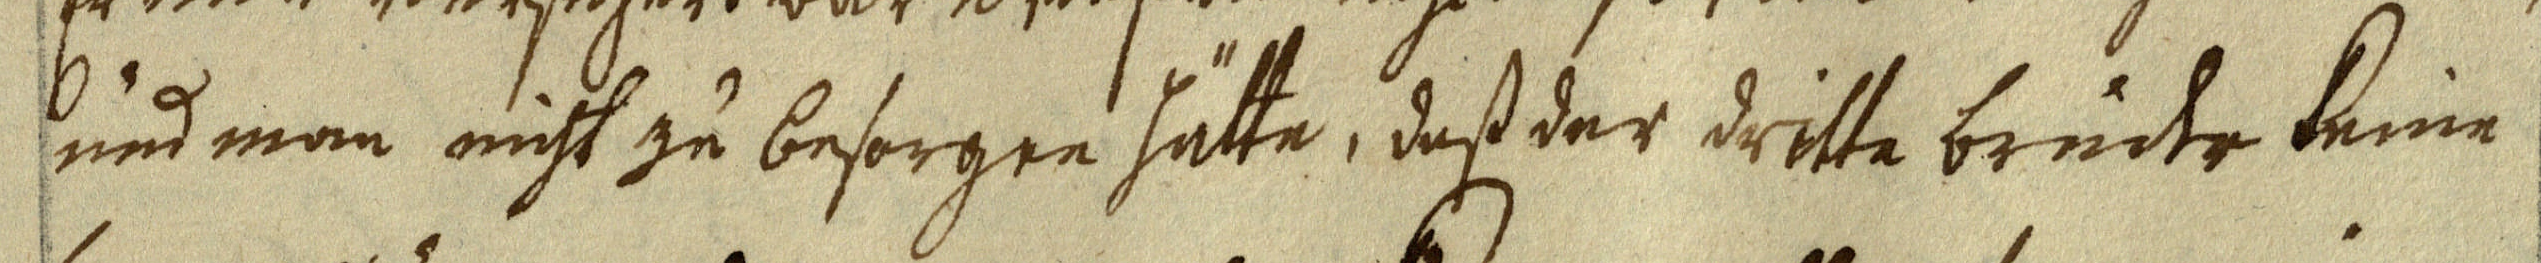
und man nicht zu besorgen hätte, daß der dritte Bruder keine
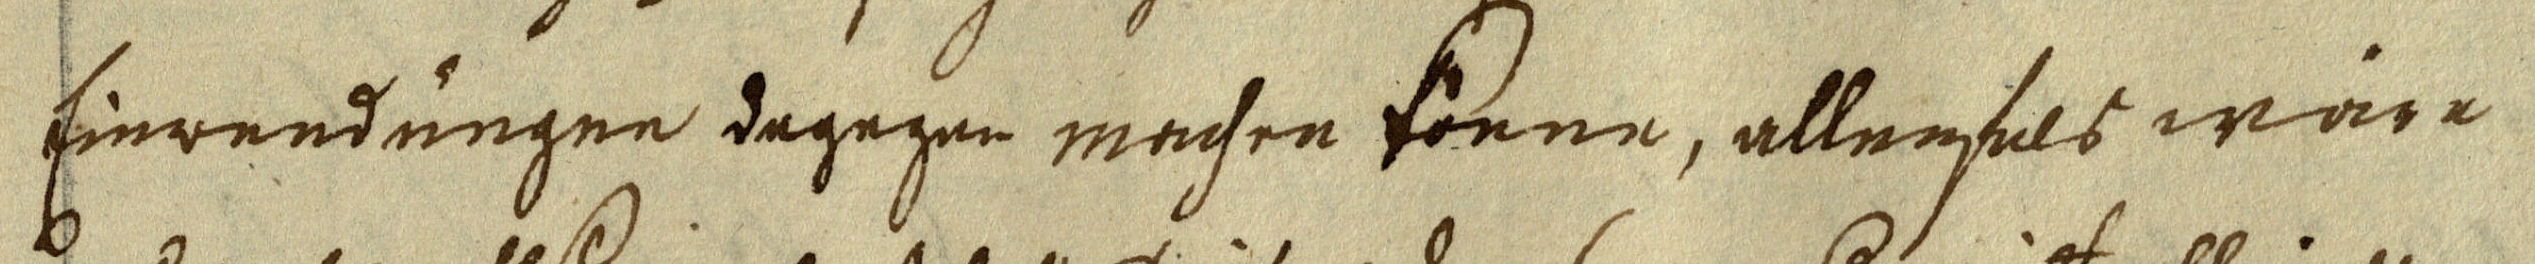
Einwendungen dagegen machen könne, allenfals wäre
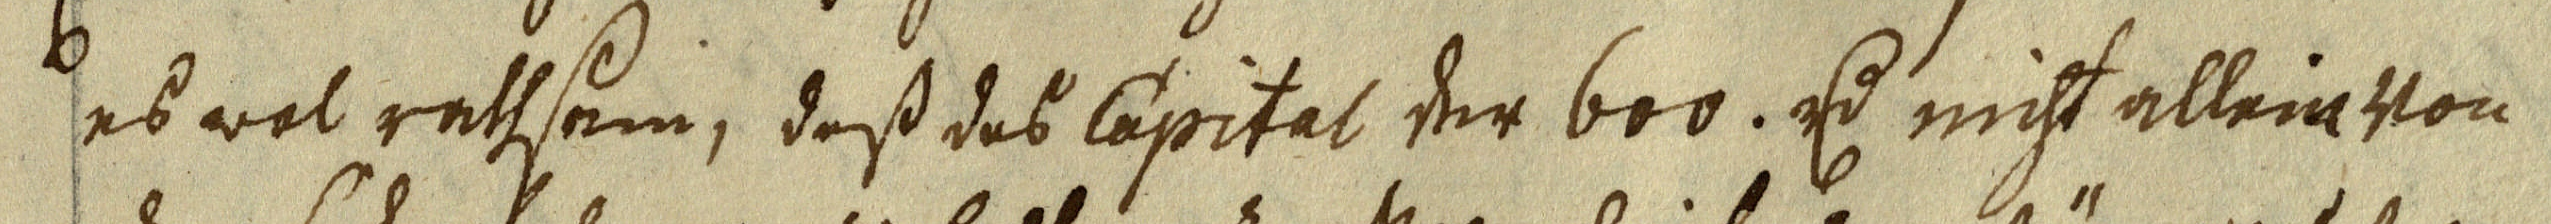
es wohl rathsam, daß das Capital der 600 rt. nicht allein von
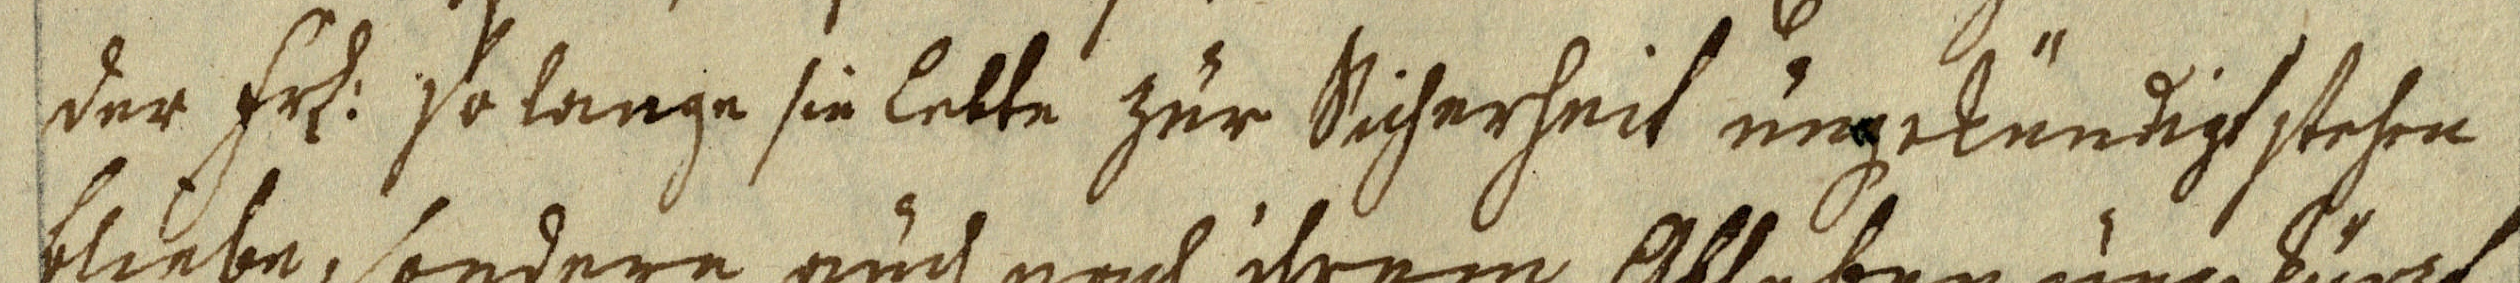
der Frl. so lange sie lebte zur Sicherheit ungekündigt stehen
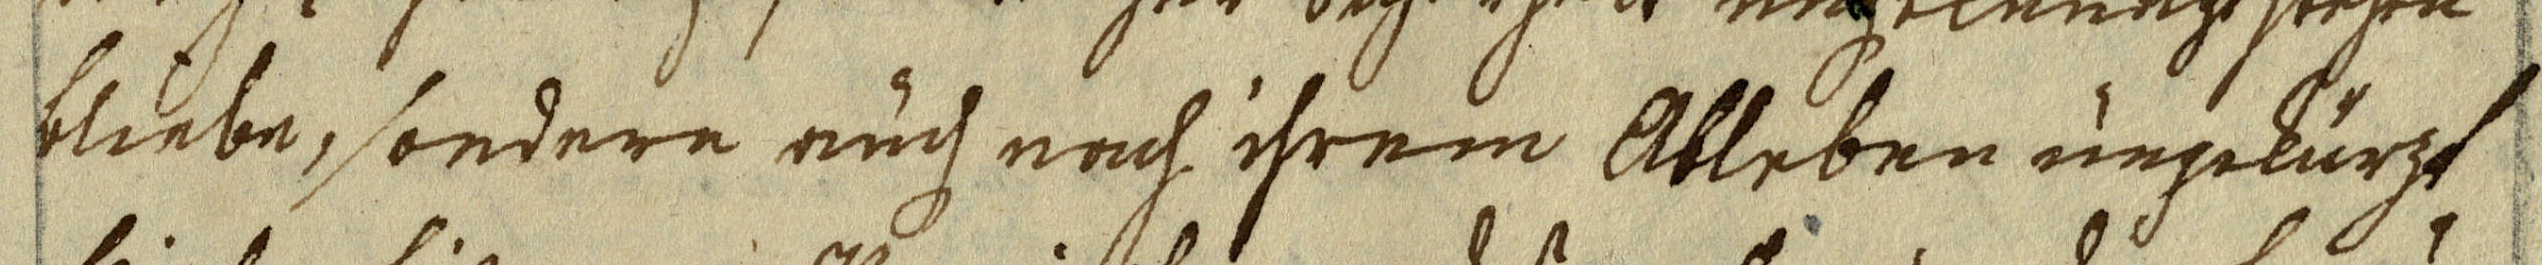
bliebe, sondern auch nach ihrem Ableben ungekürzt
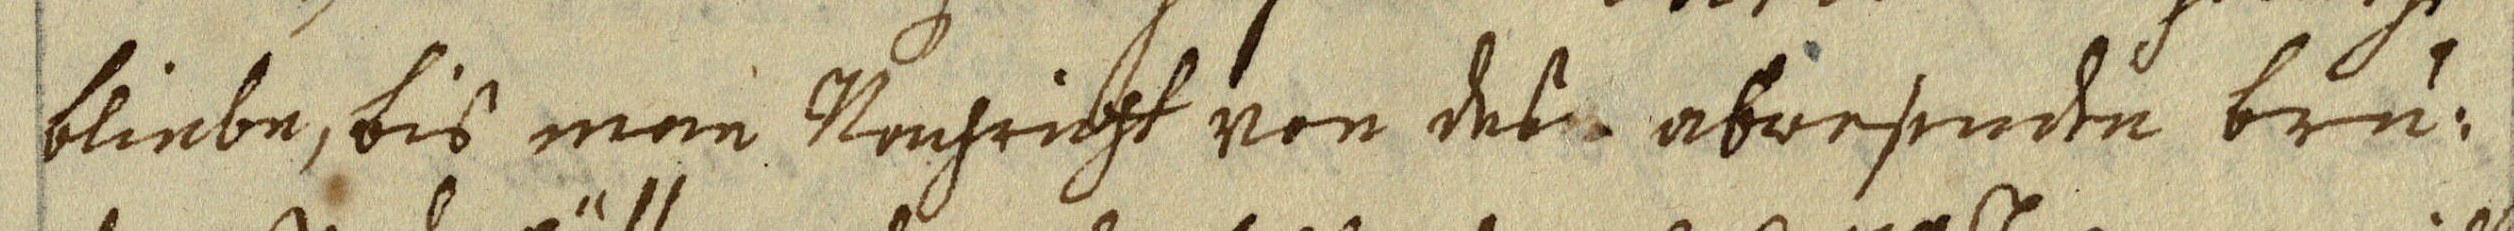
bliebe, bis man Nachricht von des abwesenden Bru¬
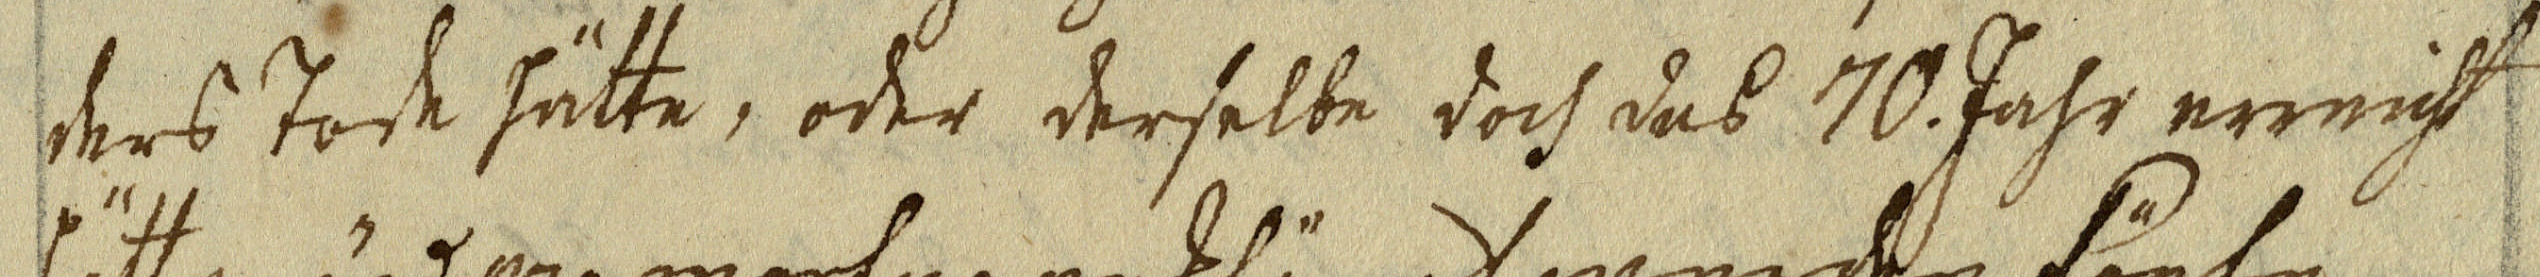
ders Tode hätte, oder derselbe doch das 70 Jahr erreicht
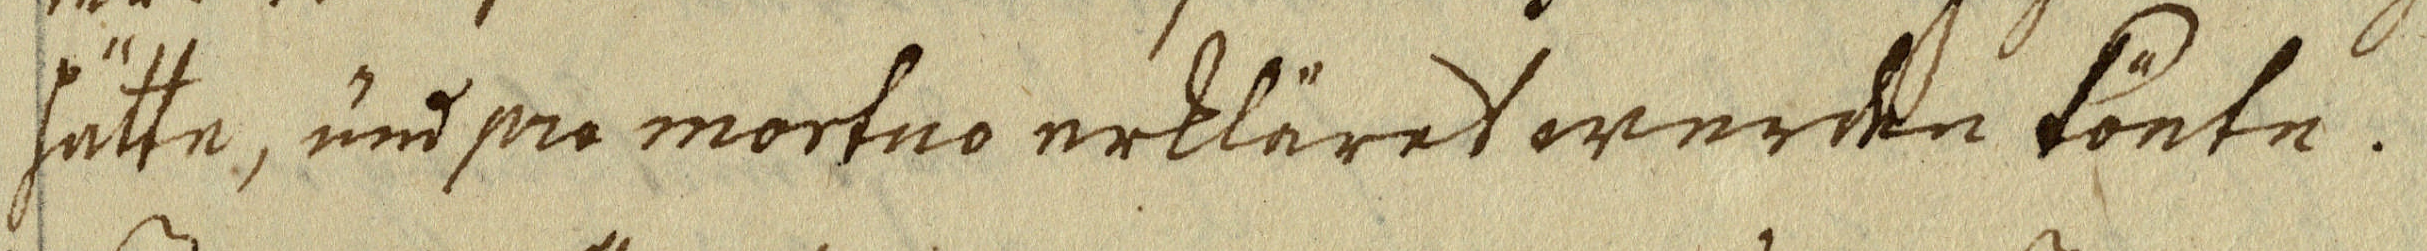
hätte, und pro mortuo erkläret werden könte.
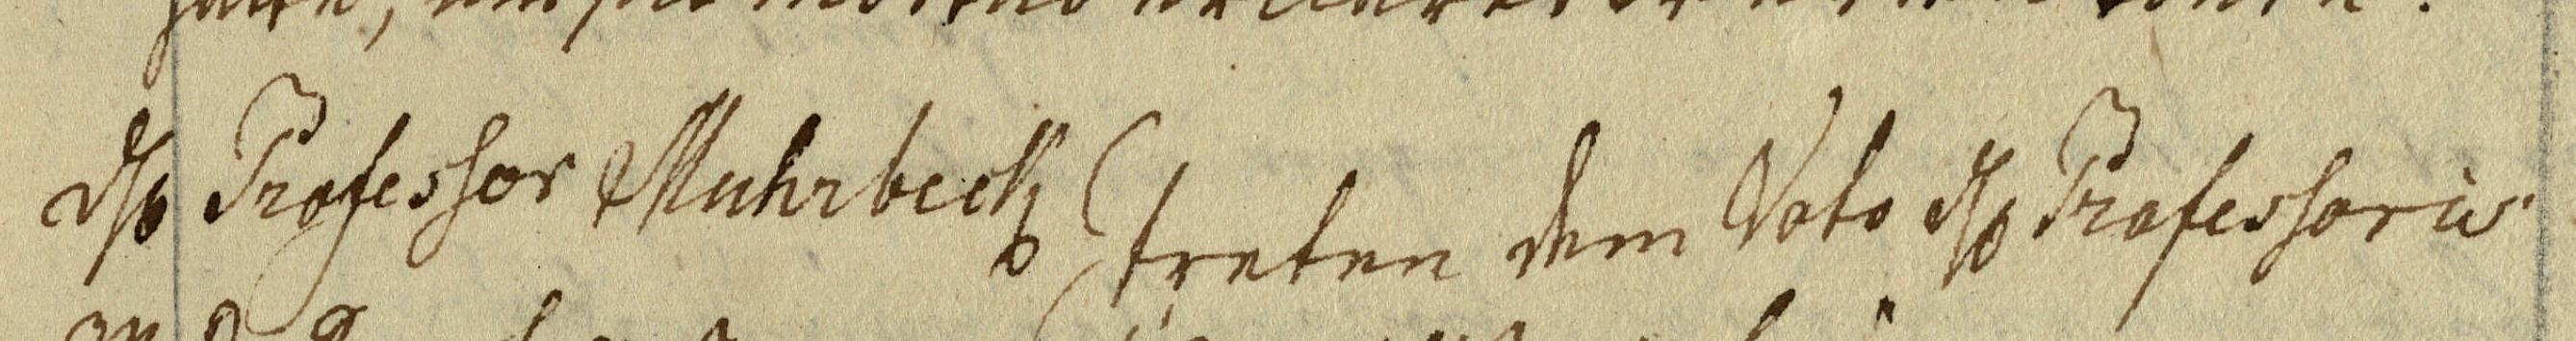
dh Professor Muhrbeck ( treten dem Voto dh Professoris
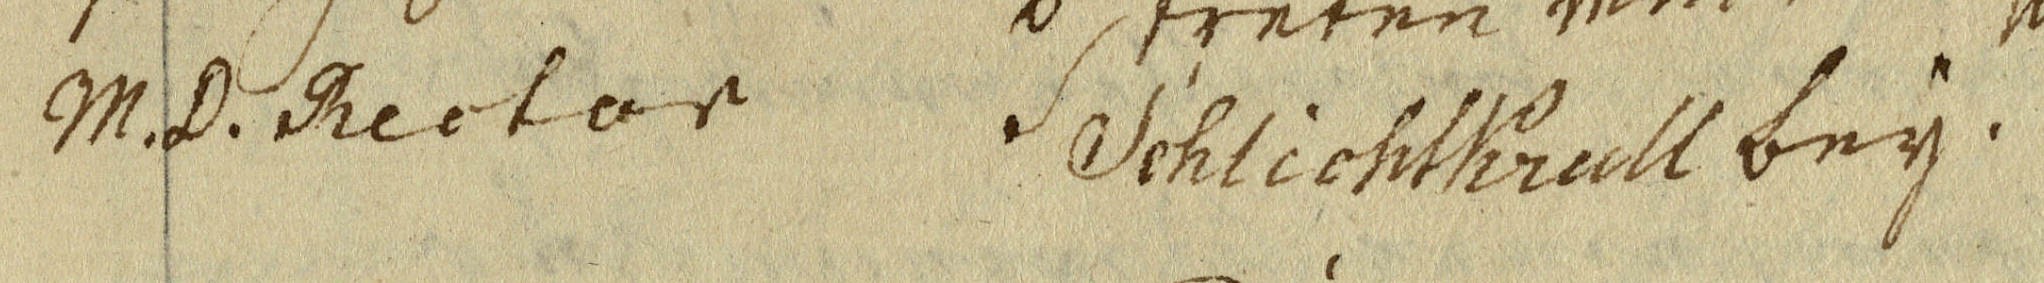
M. D. Rector ( Schlichtkrull beÿ)
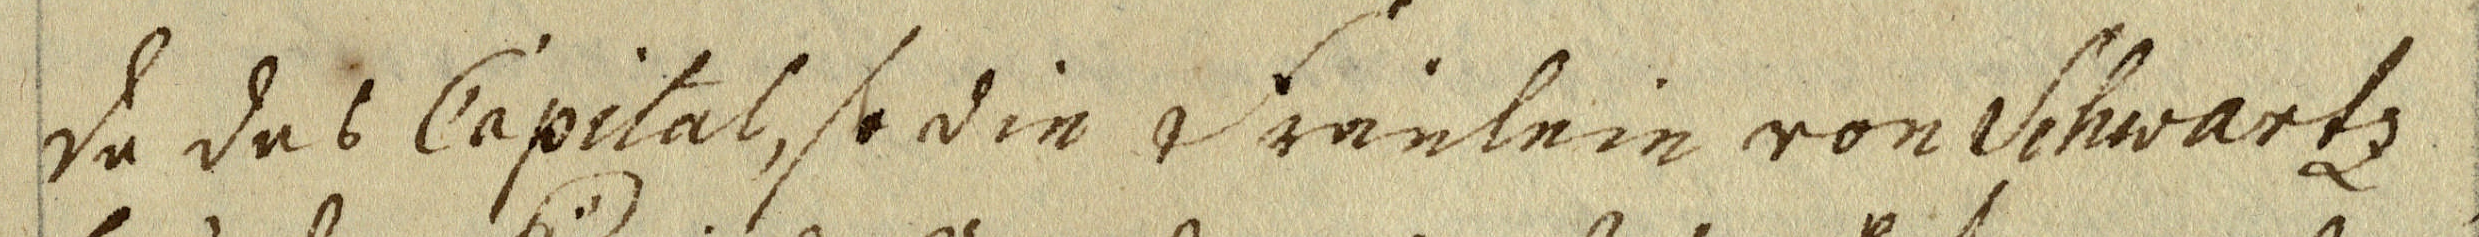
Da das Capital, so die Fräulein von Schwartz
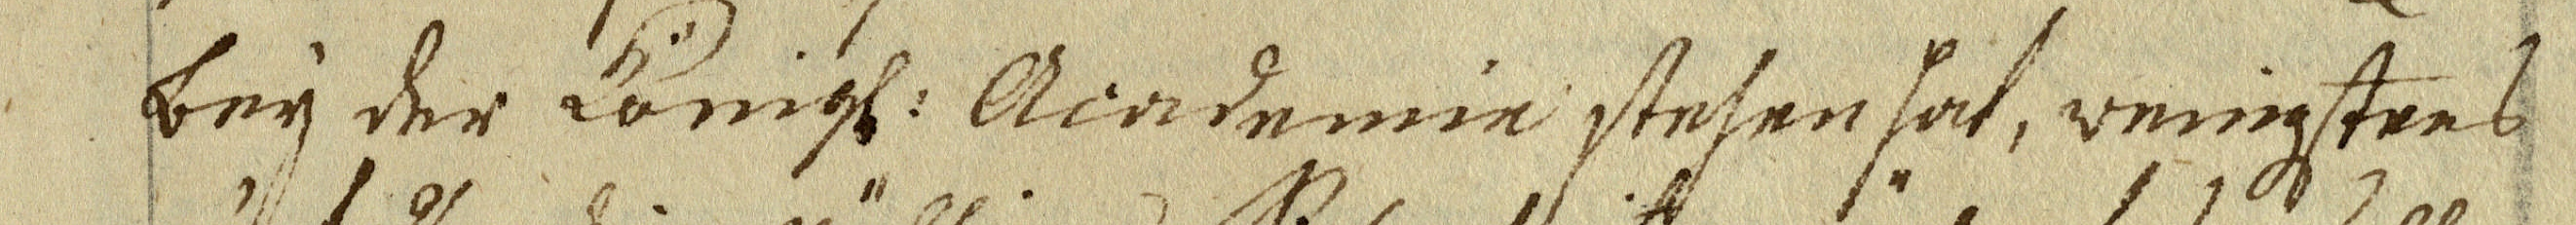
beÿ der Königl. Academie stehen hat, wenigstens
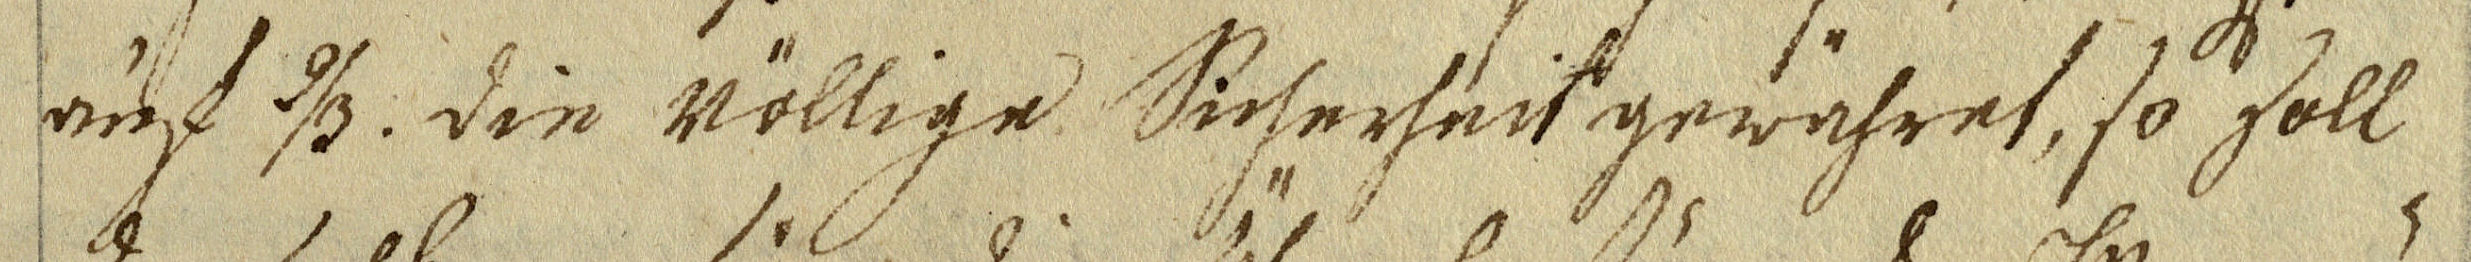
auf 2/3. die völlige Sicherheit gewähret, so soll
